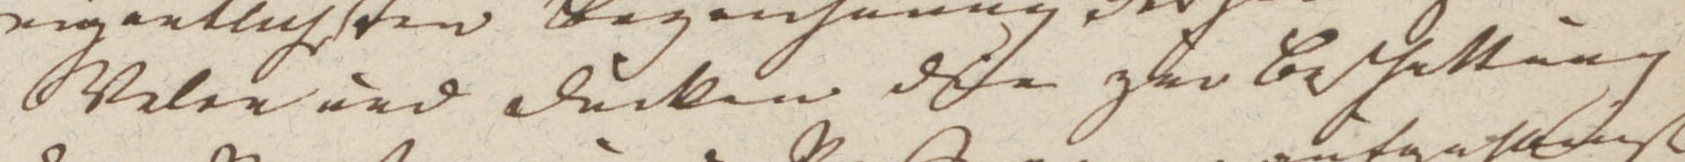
Velen und Decken die zur Beschattung
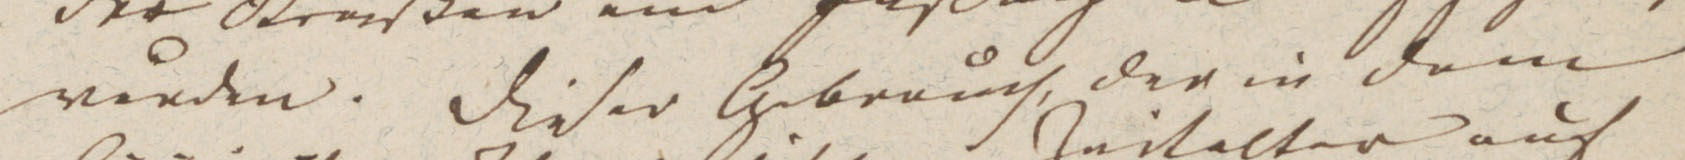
wurden. Dieser Gebrauch, der in dem
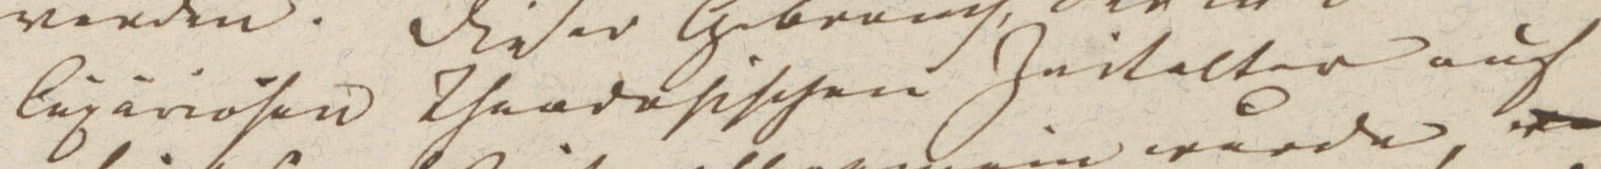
luxuriösen Theodosischen Zeitalter auf
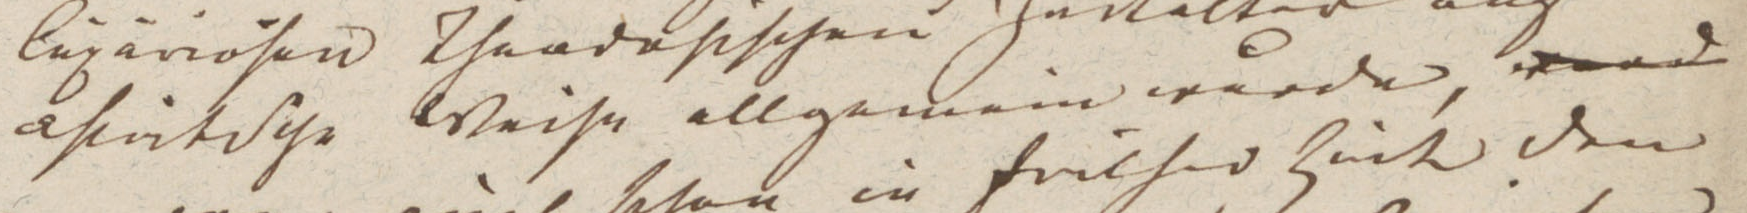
asiatische Weise allgemein wurde, ward
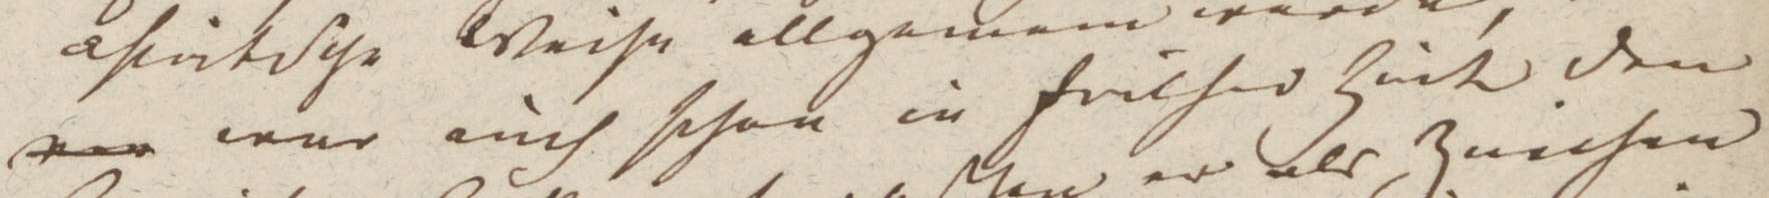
von war auch schon in früher Zeit den
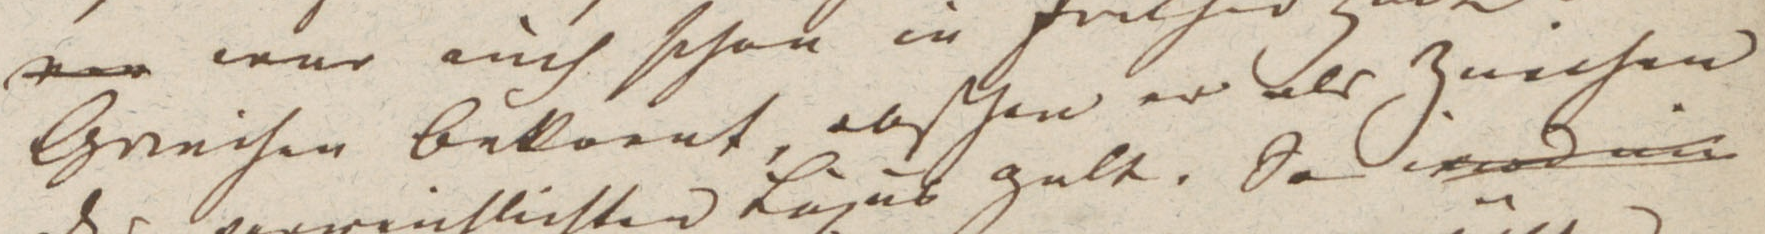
Griechen bekannt, obschon er als Zeichen
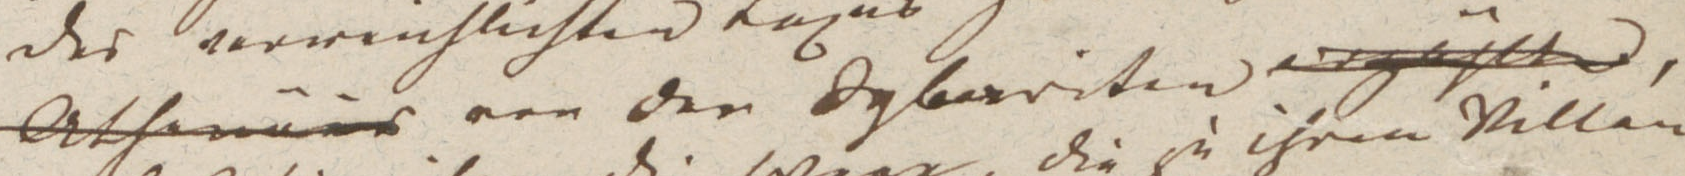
Athenäus von den Sybariten erzählt,
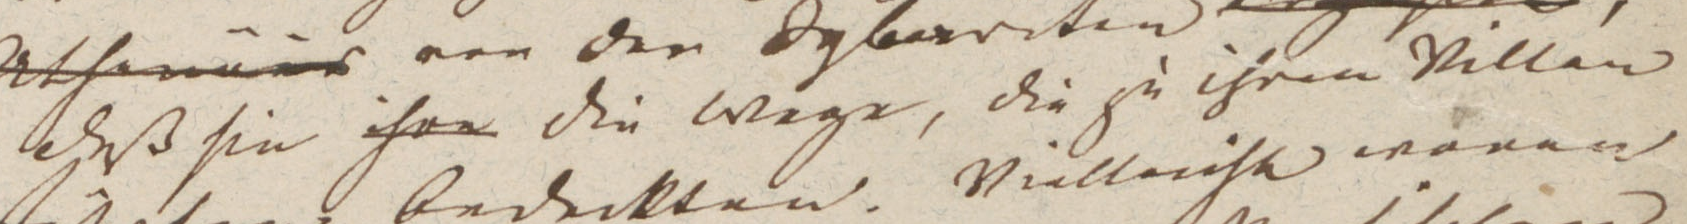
dass sie ihre die Wege, die zu ihren Villen
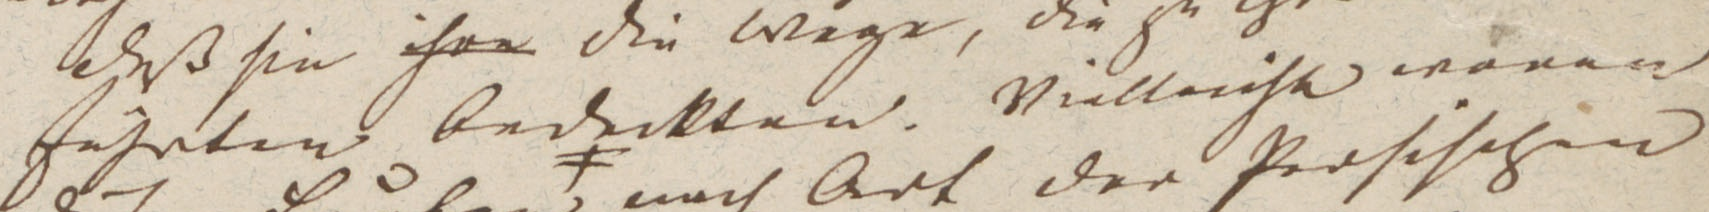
führten bedeckten. Vielleicht waren
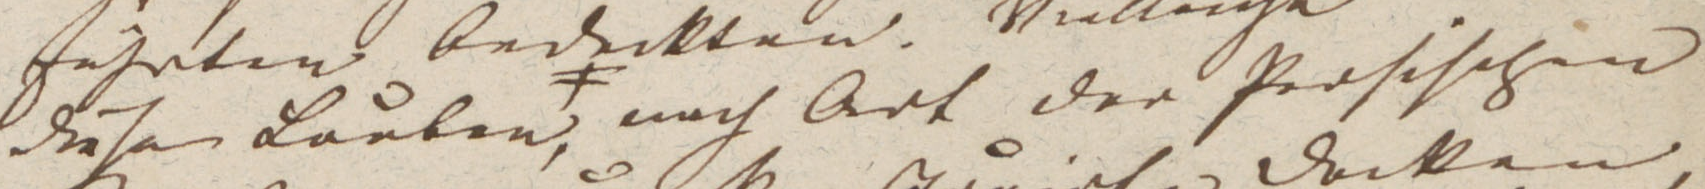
diese Lauben, % nach Art der Persischen
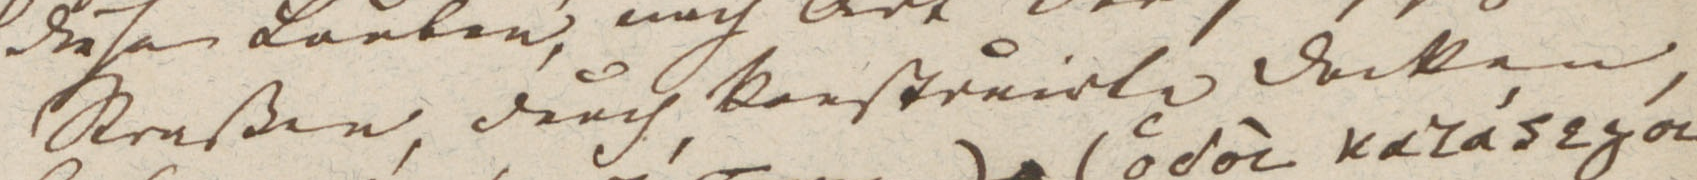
Strassen, durch konstruirte Decken,
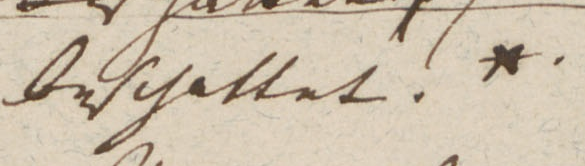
beschattet. %
